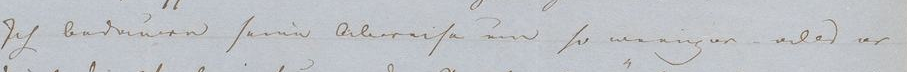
Ich bedaure seine Abreise um so weniger als er
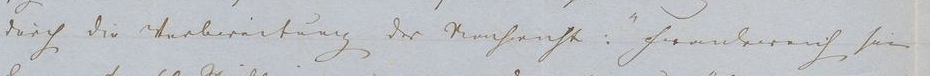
durch die Verbreitung der Nachricht: «Frankreich sei
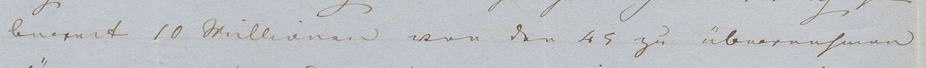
bereit 10 Millionen von den 45 zu übernehmen
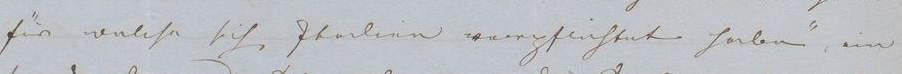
für welche sich Italien verpflichtet habe», ein
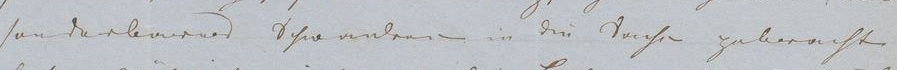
sonderbares Schwanken in die Sache gebracht
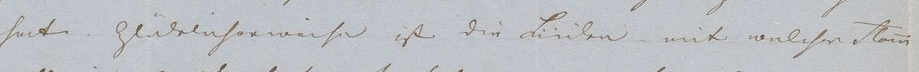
hat. Glüklicherweise ist die Linke – mit welcher Stamm
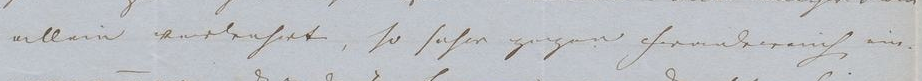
allein verkehrt, so sehr gegen Frankreich ein-
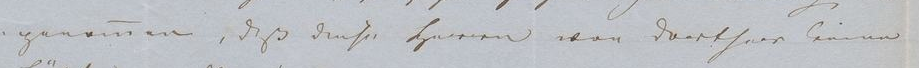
genommen, daß diese Herrn von dorther keine
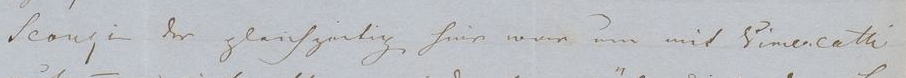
Scanzi – der gleichzeitig hier war um mit Vimercatti
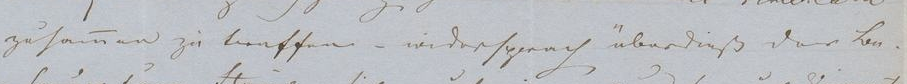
zusammen zu treffen – widersprach überdieß der Be-
